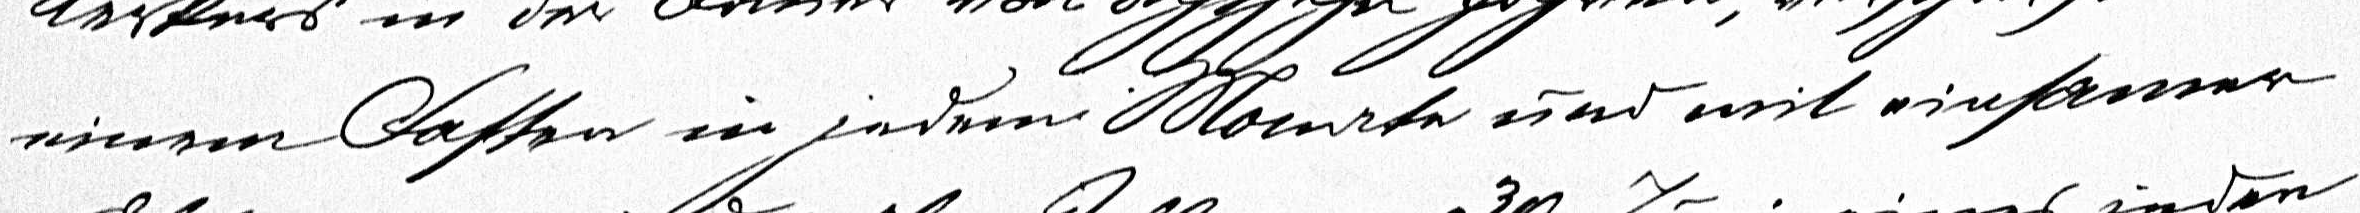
einem Fasten in jedem Monate und mit einsamer
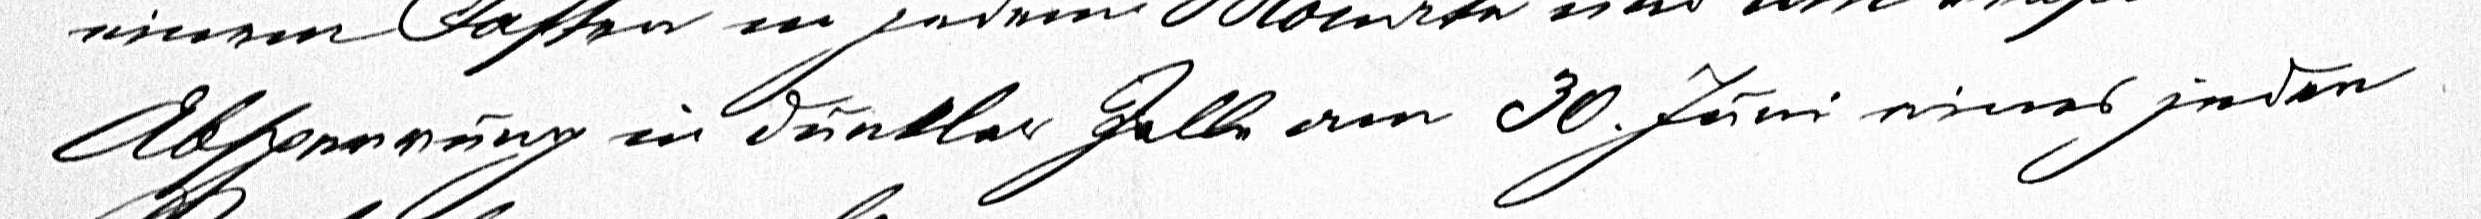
Absperrung in dunkler Zelle am 30. Juni eines jeden
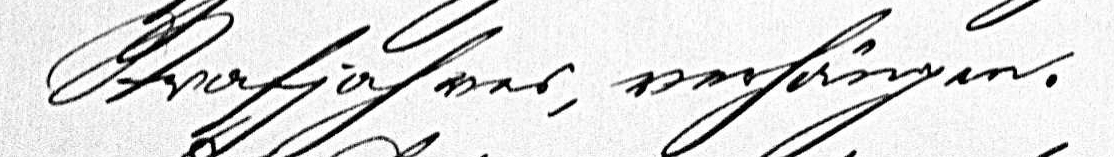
Strafjahres, verhängen.
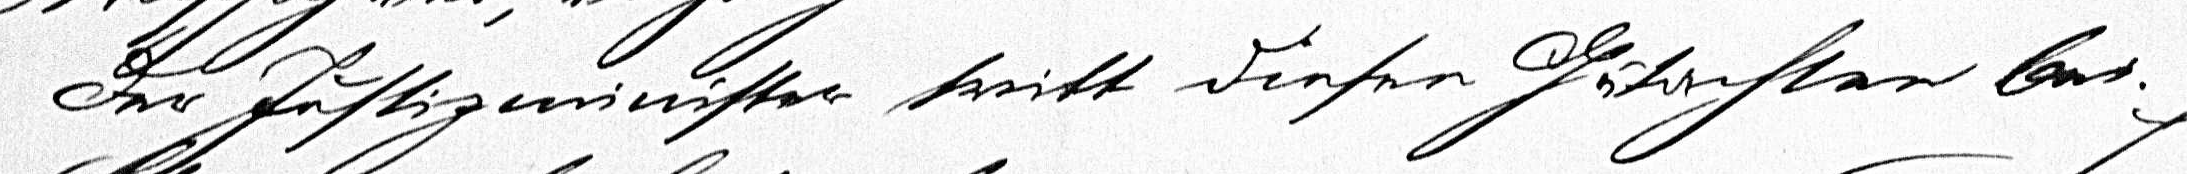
Der Justizminister tritt diesen Gutachten bei.
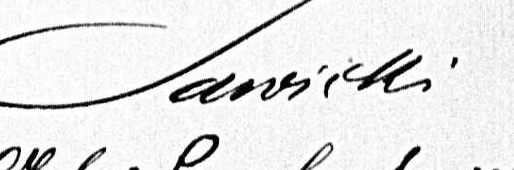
Sawicki
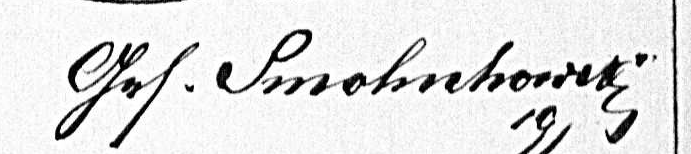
Ges. Smoluchowski
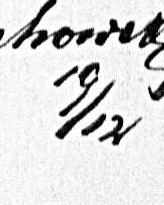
19/12
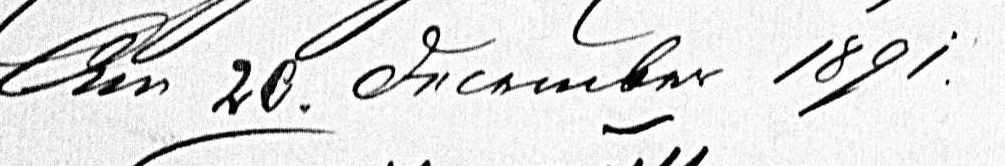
Am 20. December 1891
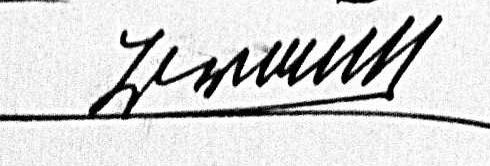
Braun
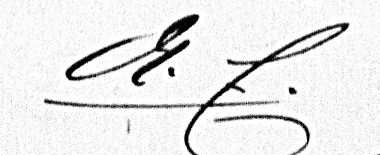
A E
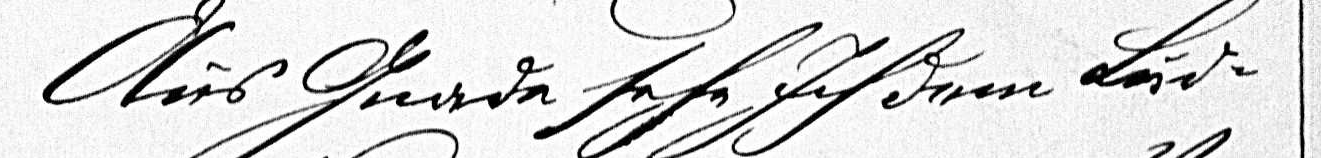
Aus Gnade sehe Ich dem Lud¬
